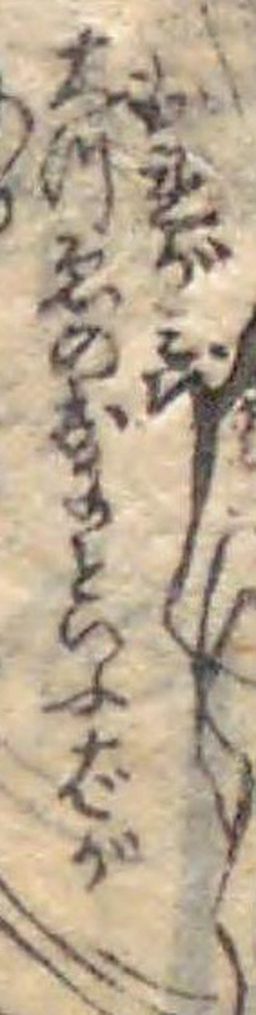大つゑのおにといふばが
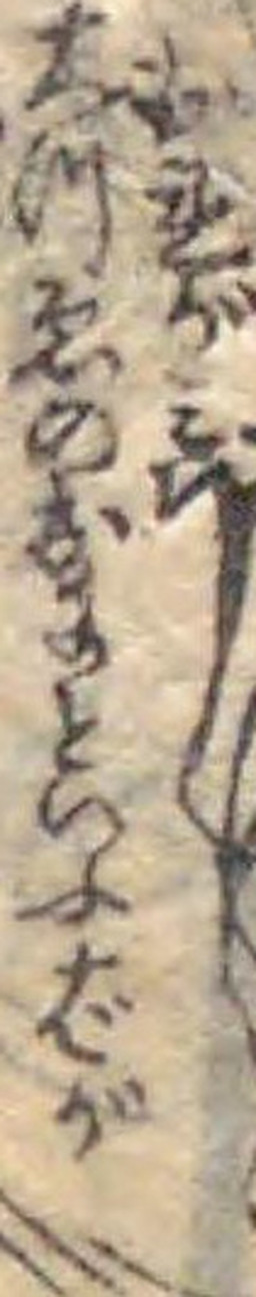大つゑのおにといふばが
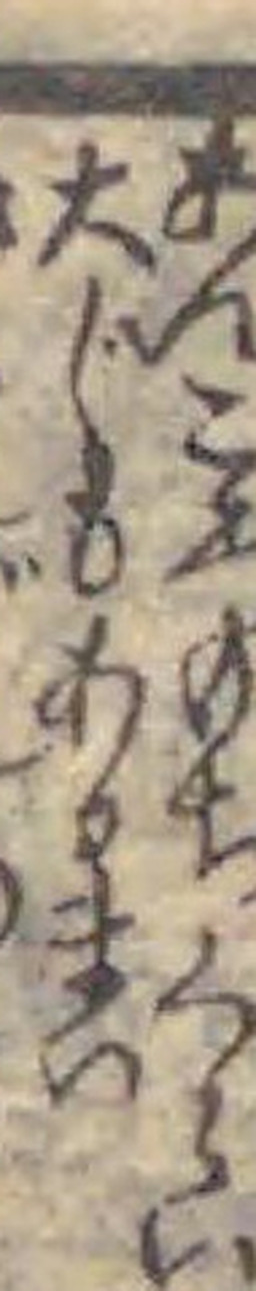大じもあるまい
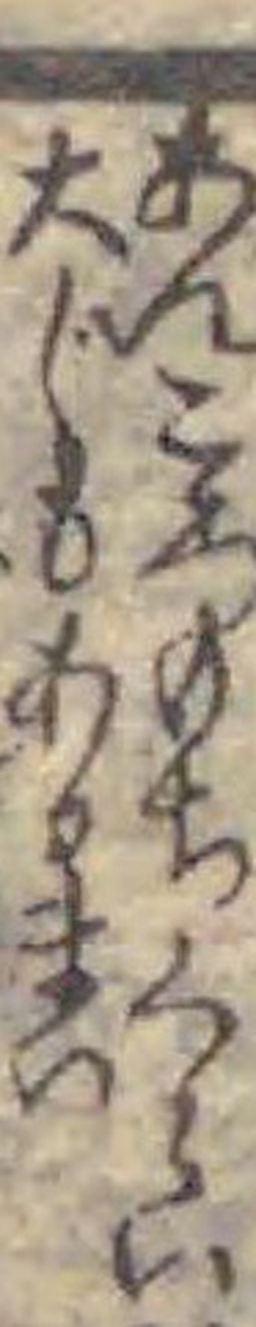大じもあるまい
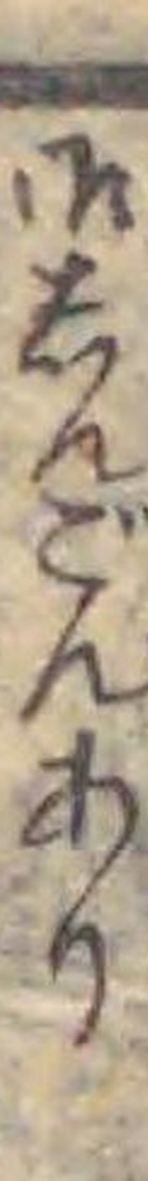御しんごんあり
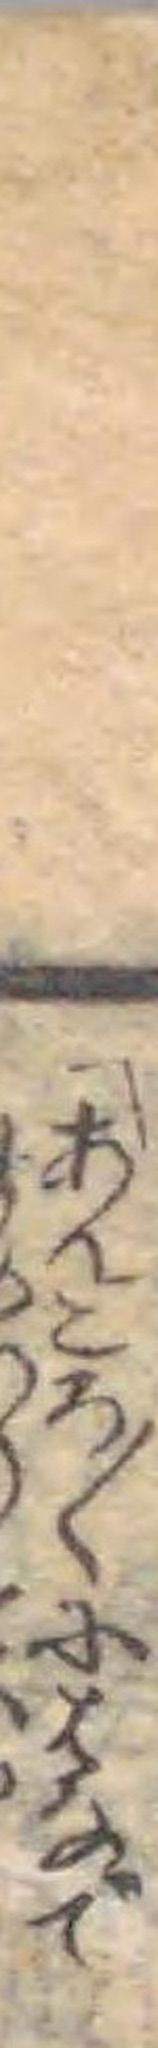〽あんころ〳〵にはなで
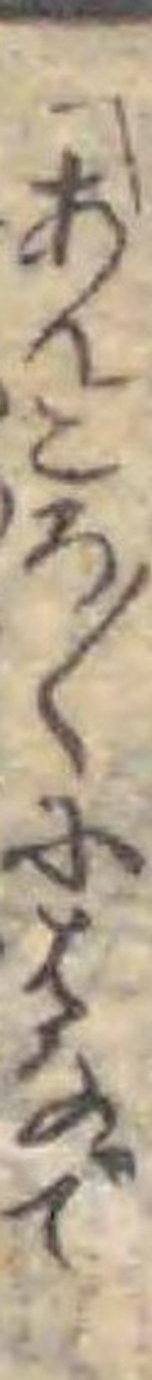〽あんころ〳〵にはなで
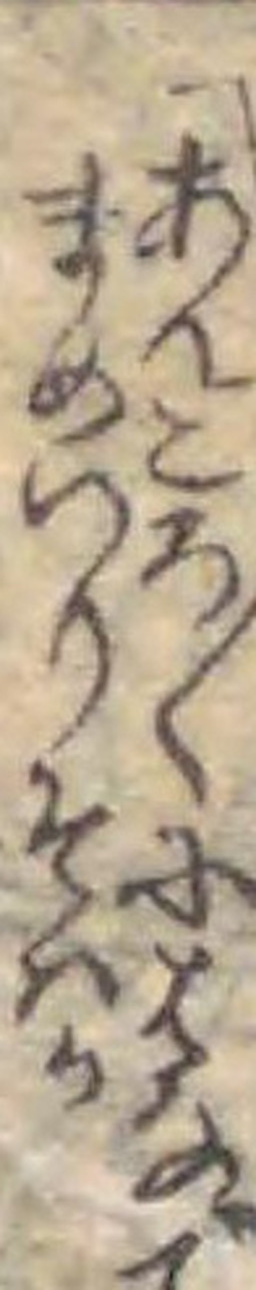まめいりそはか
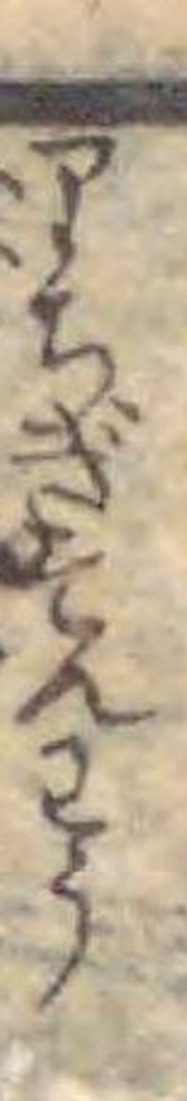アヽちぎてんわう
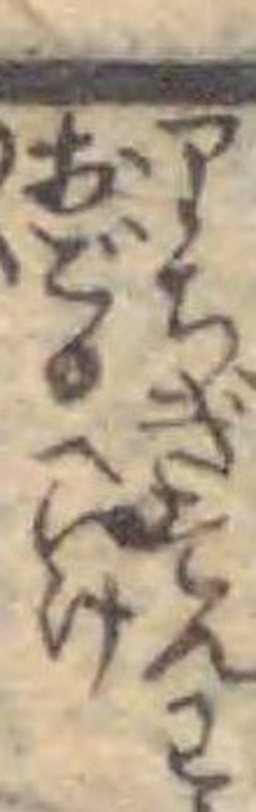おごるへいけ
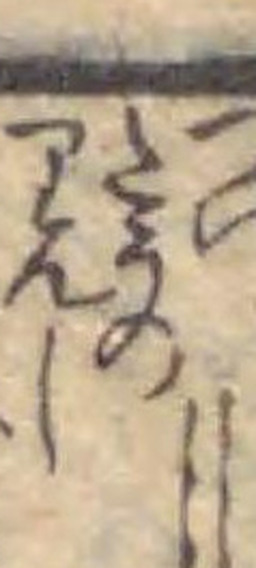りんし
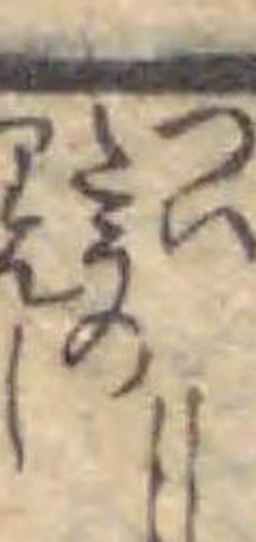とうの
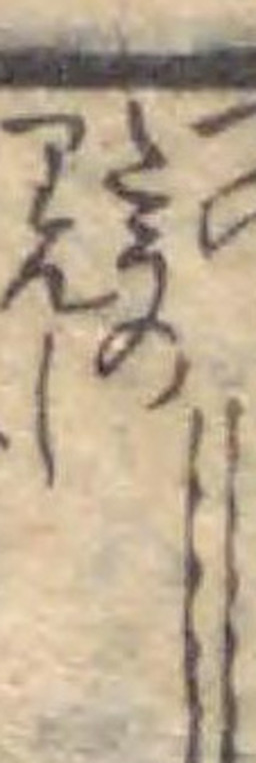りんし
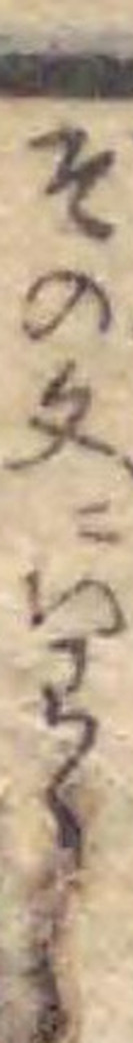その文にいわく
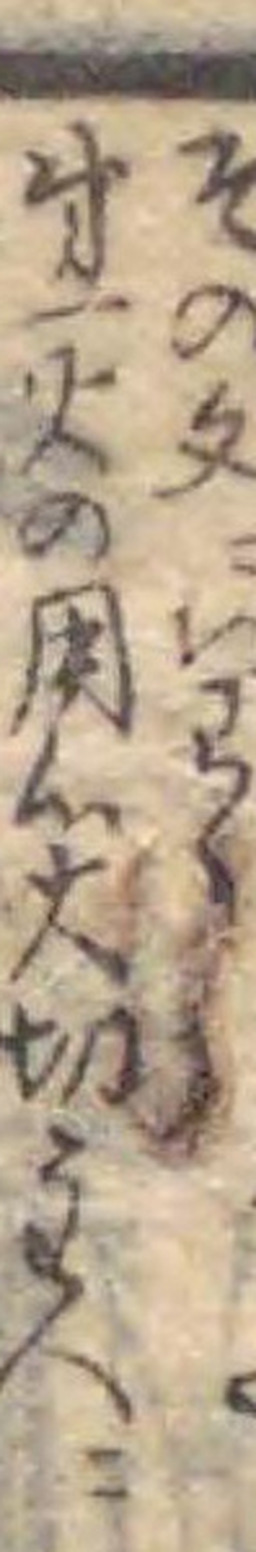第一火の用心大切主人に
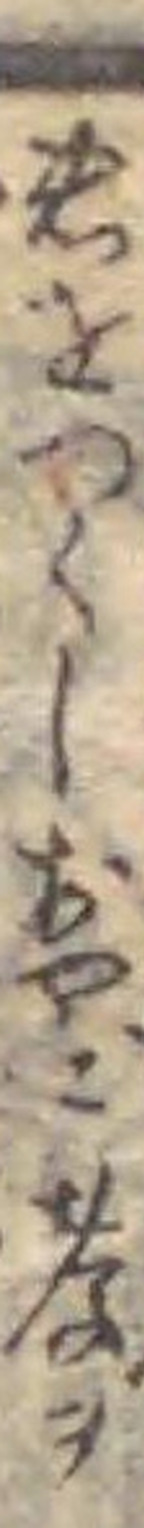忠をつくしおやに孝を
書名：身体開帳略縁起 : 3巻
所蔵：国立国会図書館 National Diet Library, JAPAN
